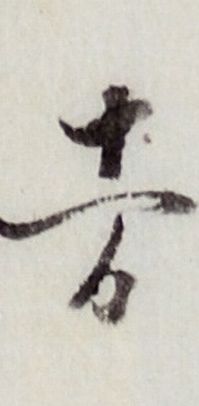十一日
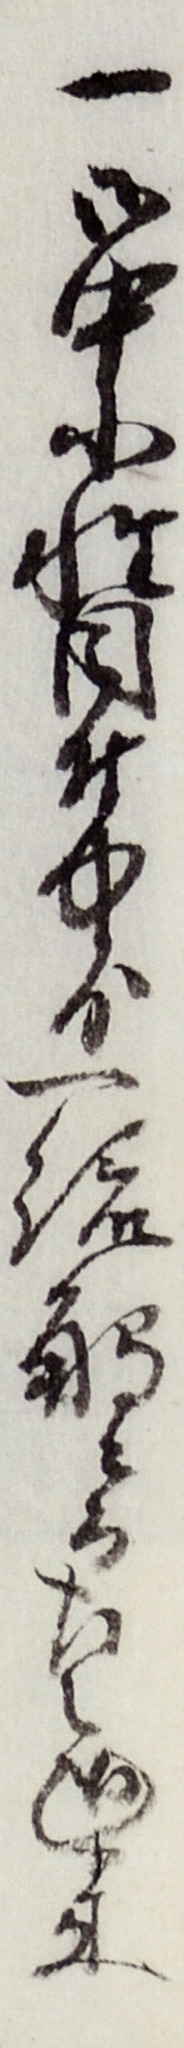一御中小性目付中ゟ一統触ニ而左之通申来
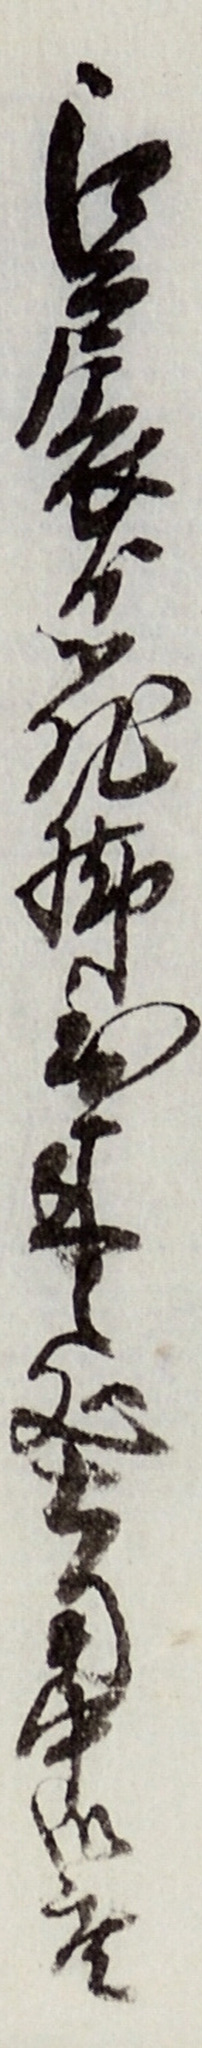江戸表ゟ飛脚到来候処土用中御座
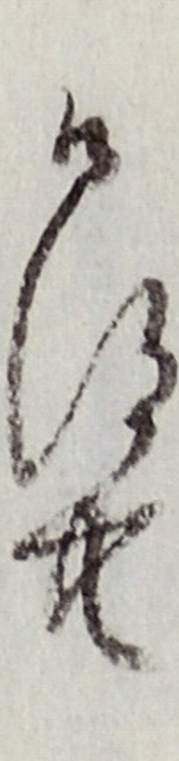候得共
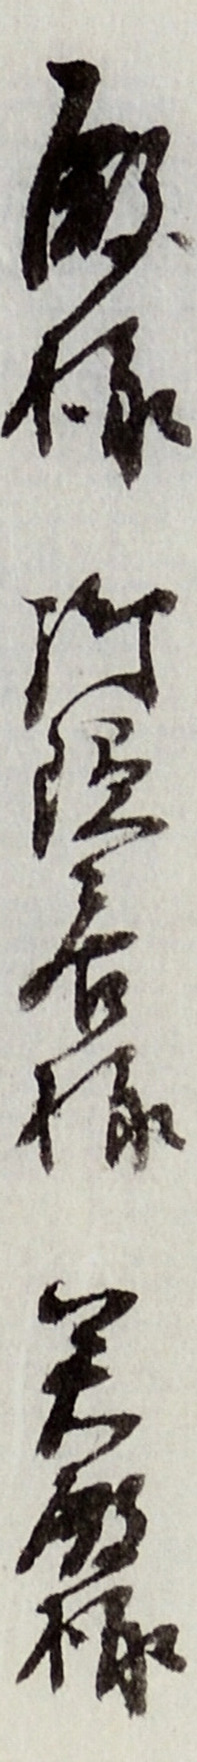殿様御隠居様若殿様
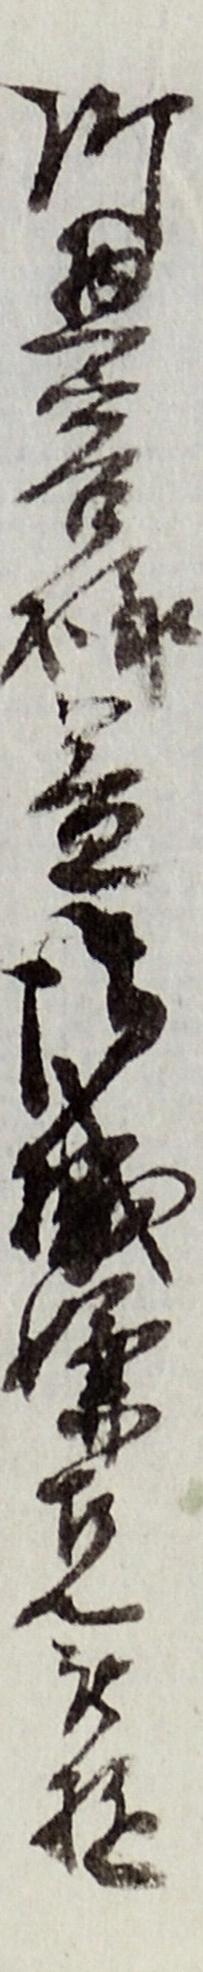御惣容様益御機嫌克被遊
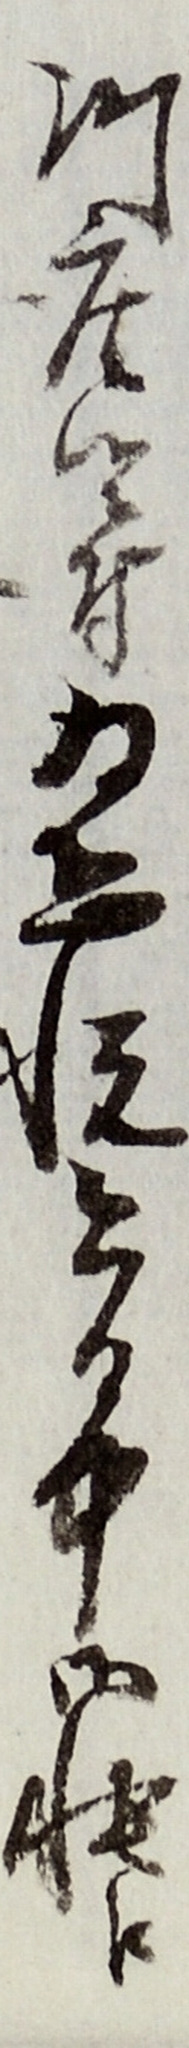御座候ニ付為恐悦今日中御帳江
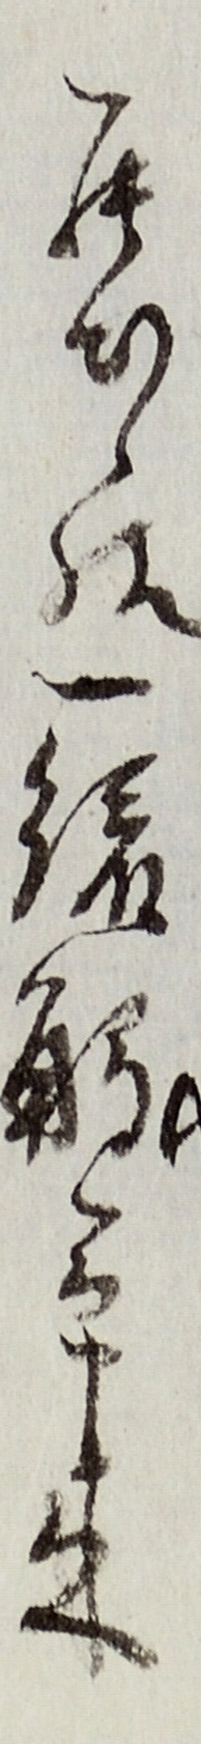罷出候様一統触候而申来
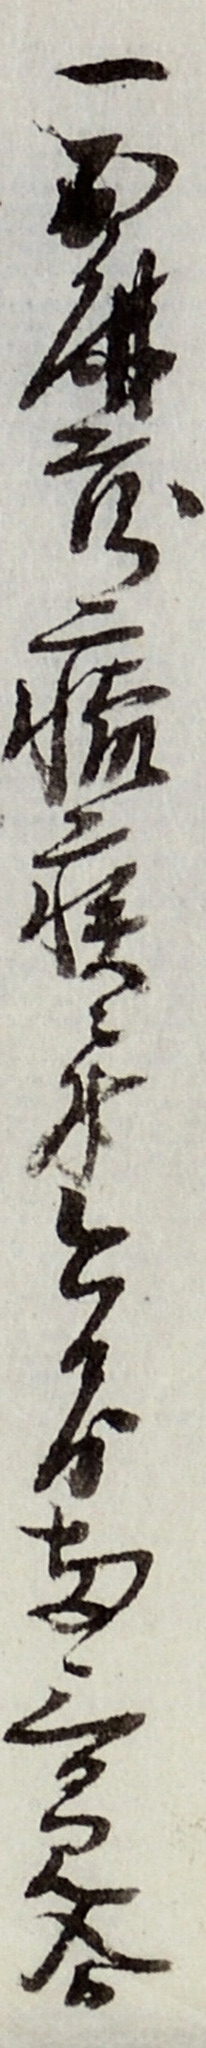一麗蔵瘧疾ニ付今日ゟ両三日見合
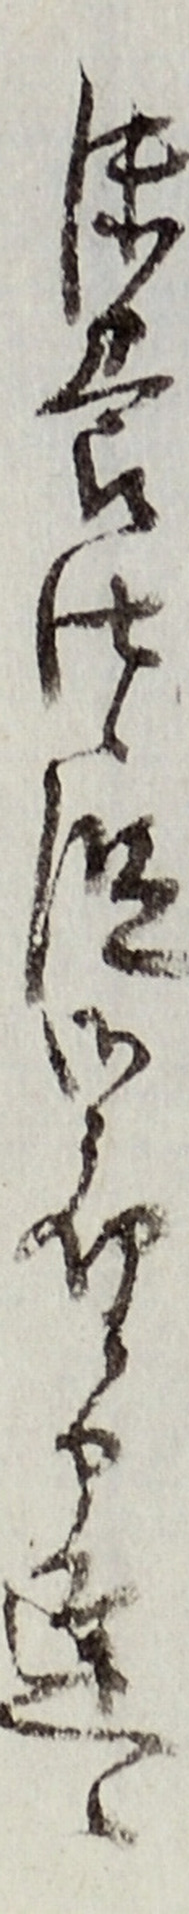保養仕候段御届申達候
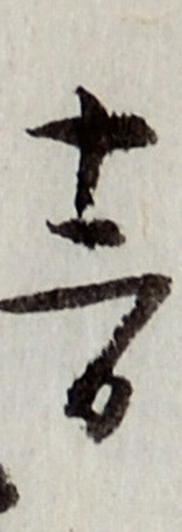十二日
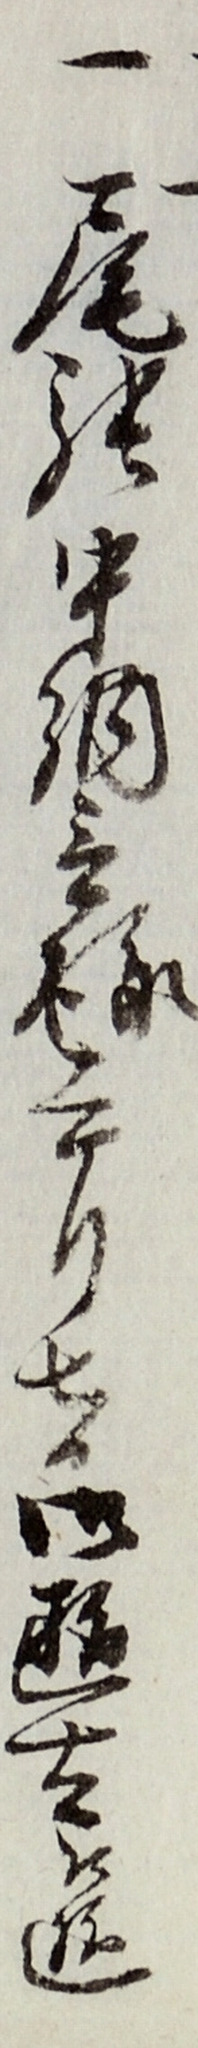一尾張中納言様去月七日御逝去被遊
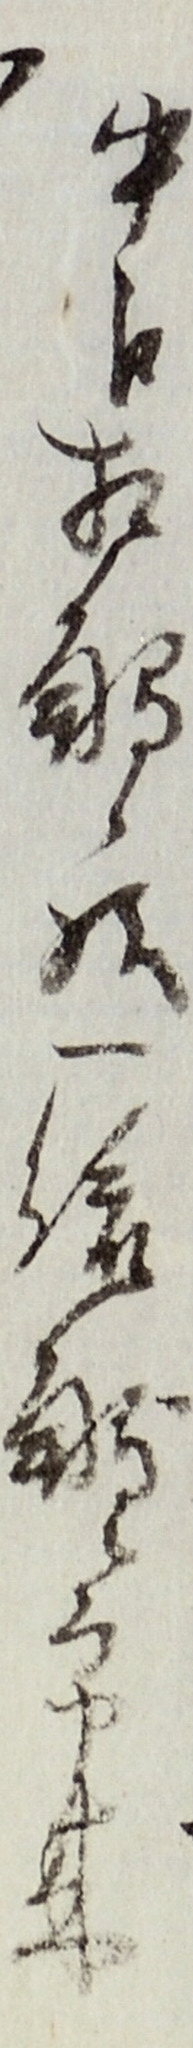中江相触候様一統触ニ而申来
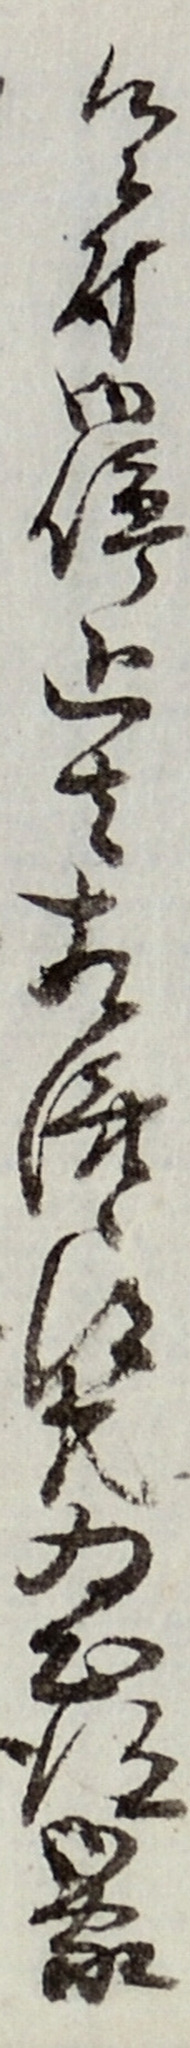候ニ付御停止者相済候得共為心得御家
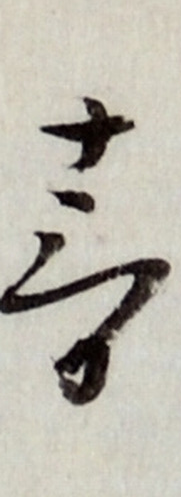十三日
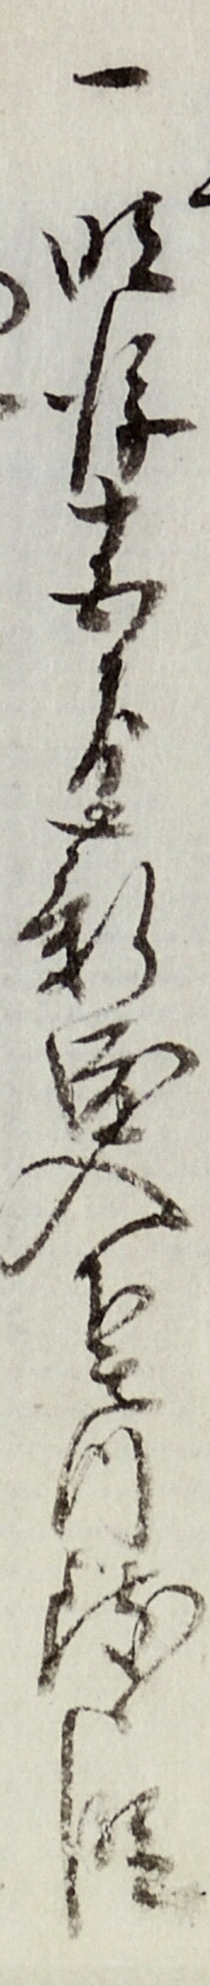一明後十五日ゟ薪渡入下モ川致候段
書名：御山方御薪方諸事御用留
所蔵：伊那市立高遠町図書館・合同会社AMANE
